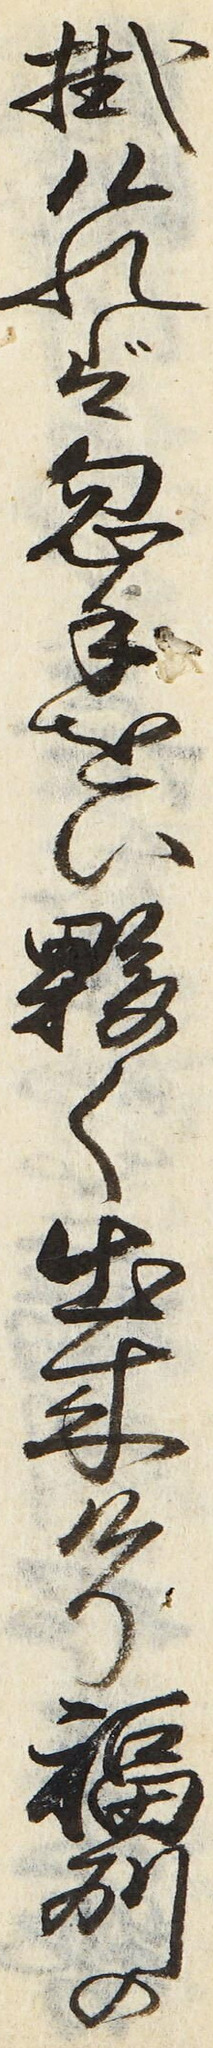掛ければ忽手をひ夥く出来けり福州の
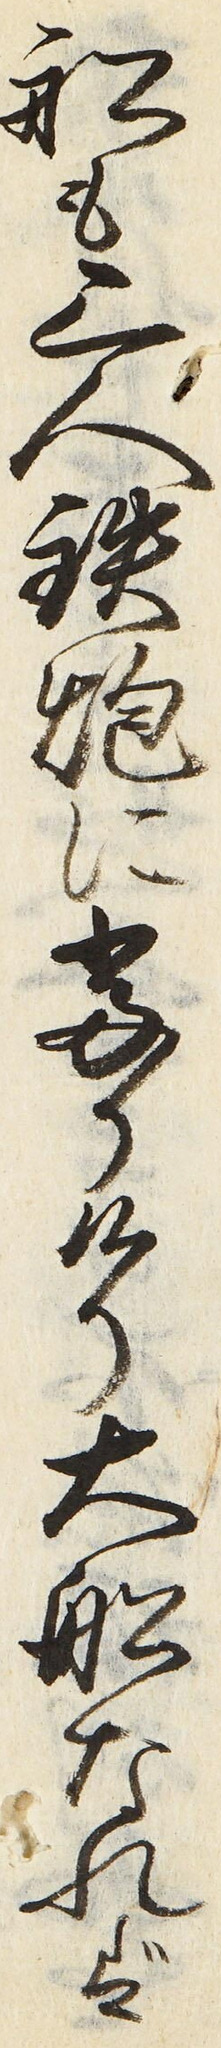船も三人鉄砲に当りけり大船なれば
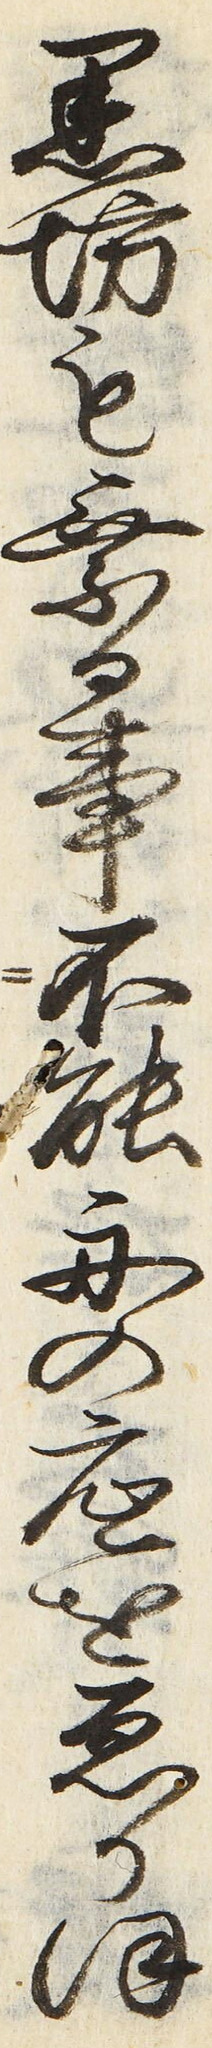黒坊も乗る事不能舟の底をゑりほ
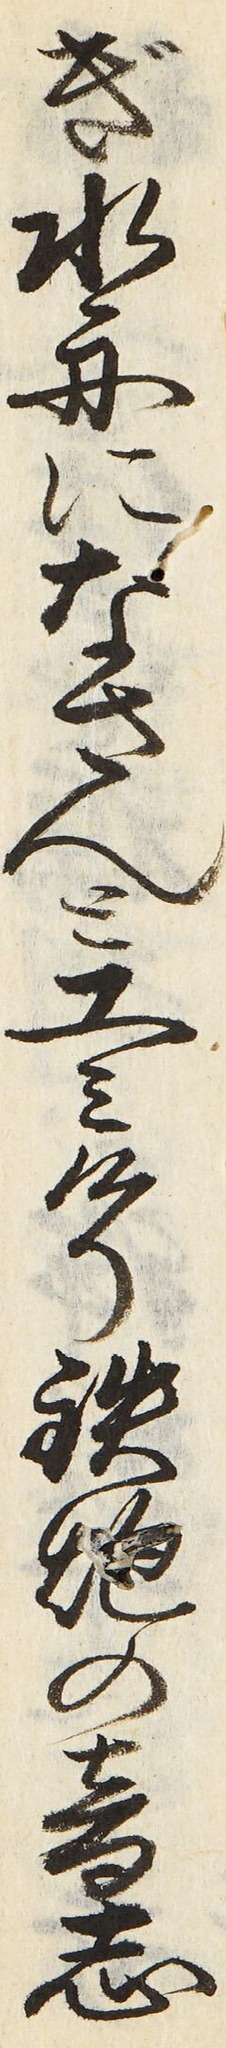ぎ水舟になさんと工みけり鉄砲の音し
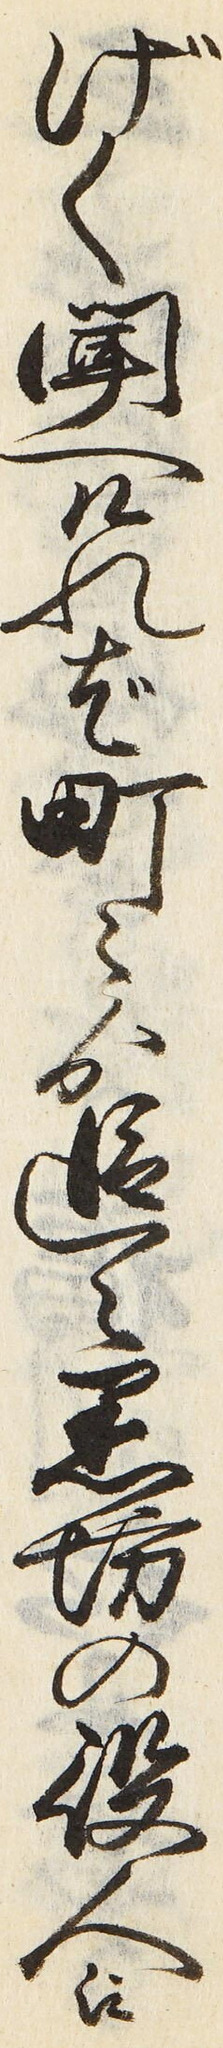げく聞へければ町々ゟ追々黒坊の役人江
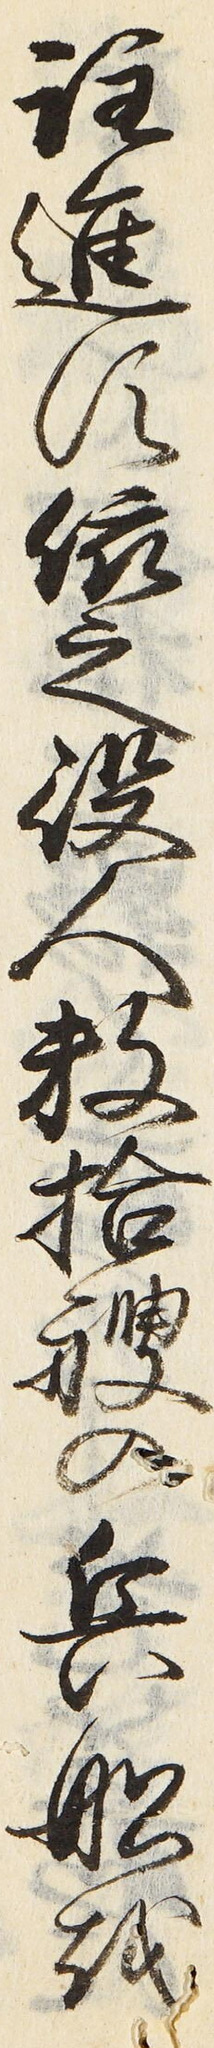注進す依之役人数拾艘の兵船を
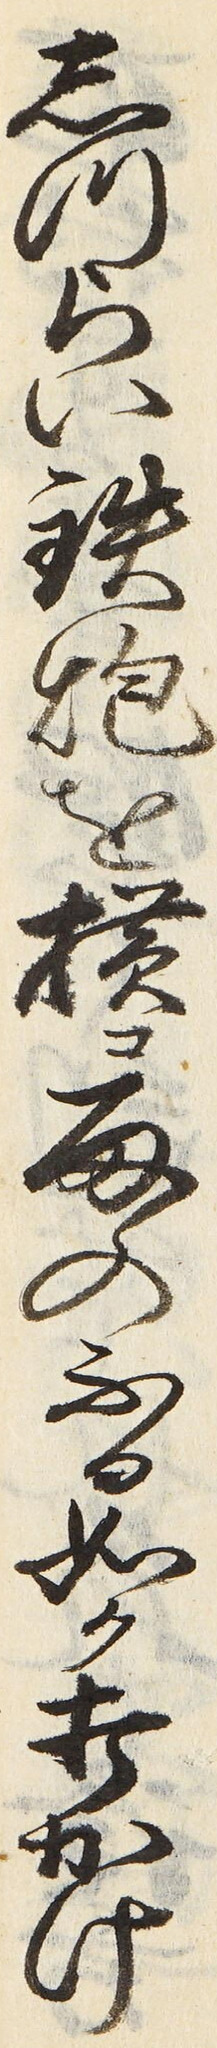しつらい鉄砲を横こ雨のふる如く打かけ
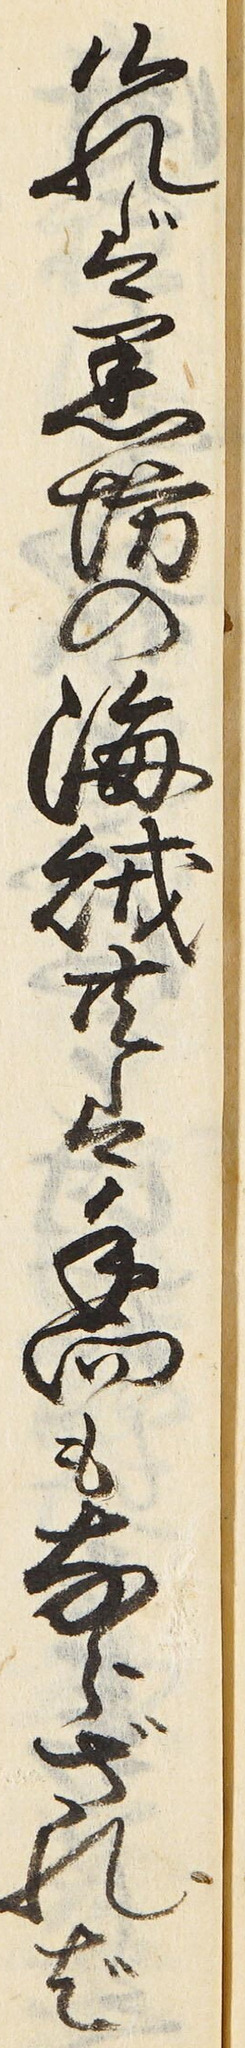ければ黒坊の海賊共は手向もならざれば
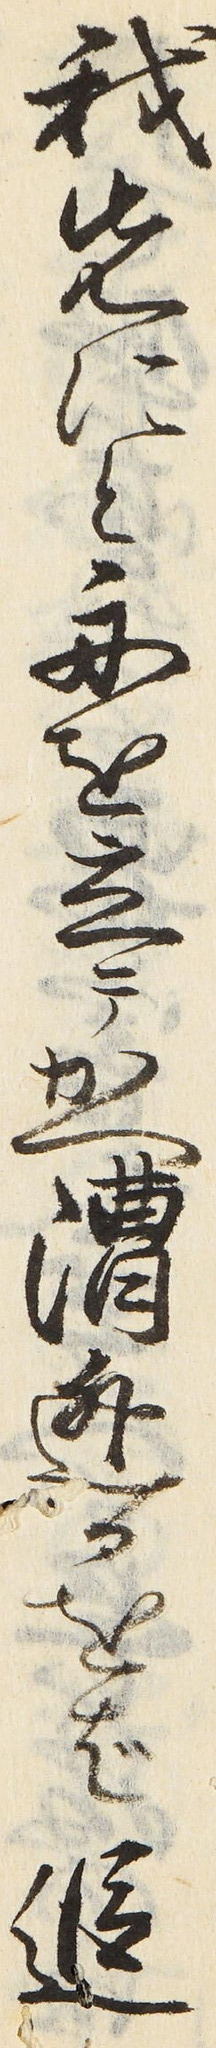我先にと舟を立てかへ漕逃るをば追
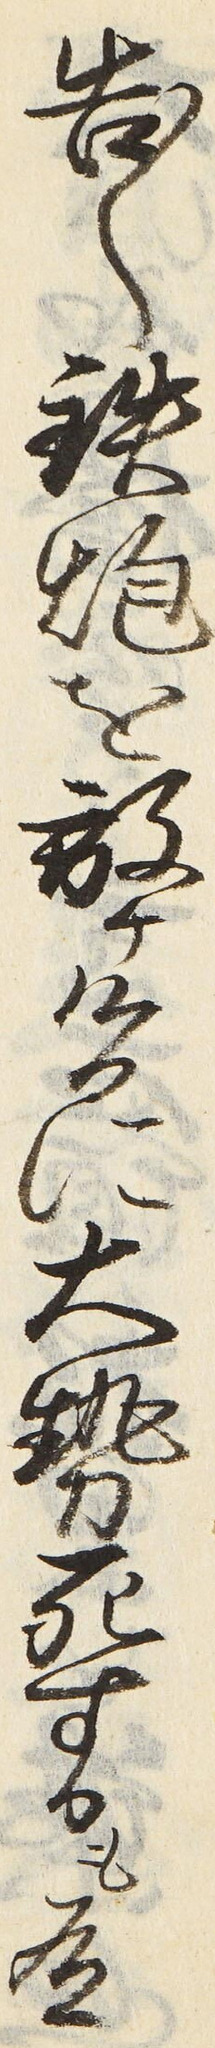告〳〵鉄砲を放ちけるに大勢死するも有
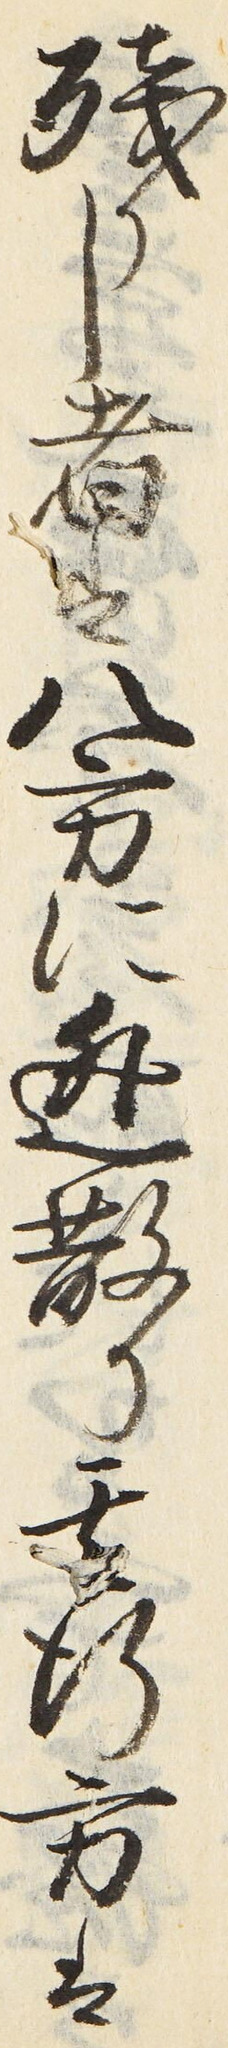残りし者は八方に逃散り其行方は
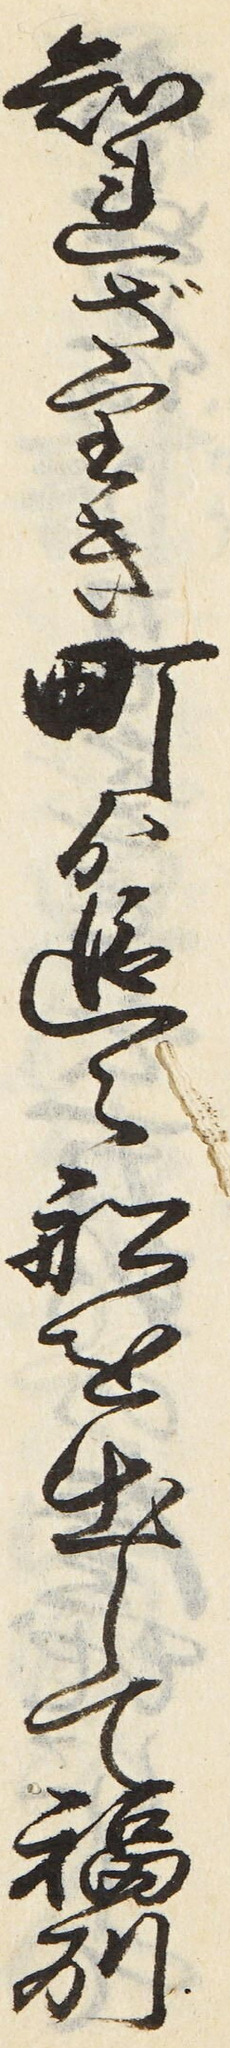知れざりき町ゟ追々船を出して福州
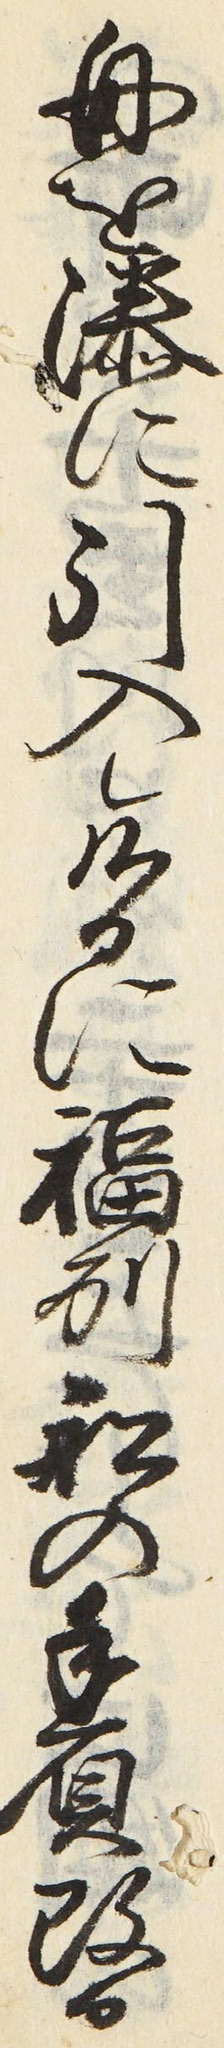舟を湊に引入れけるに福州船の手負改る
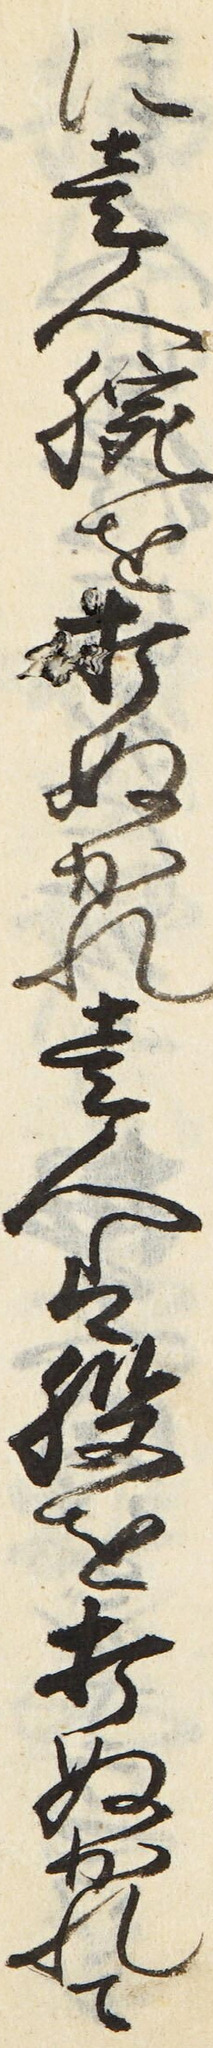に壱人腕を打ぬかれ壱人は股を打ぬかれて
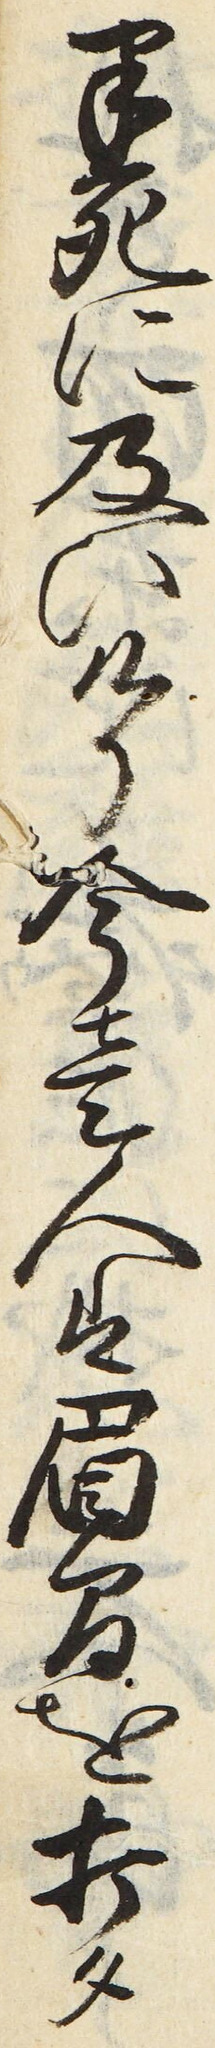半死に及ひけり今壱人は眉間を打た

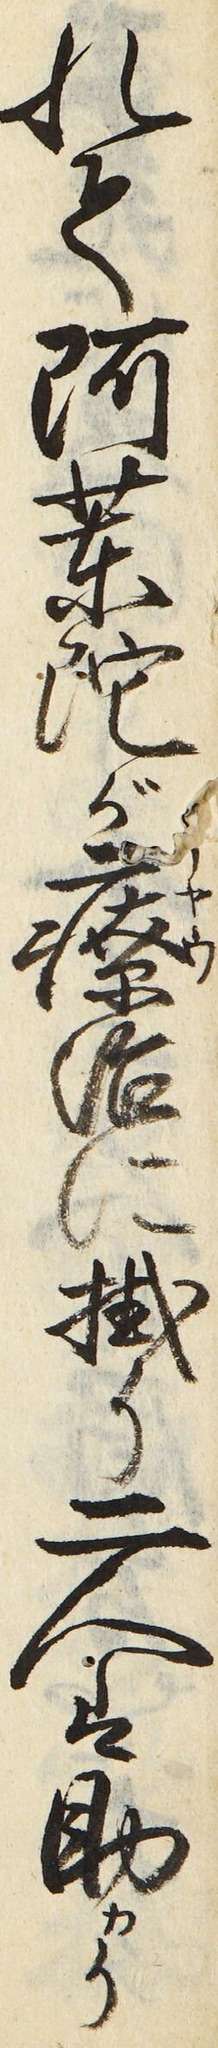れて阿蘭陀が療治に掛り二人は助かり
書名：華夷九年録
